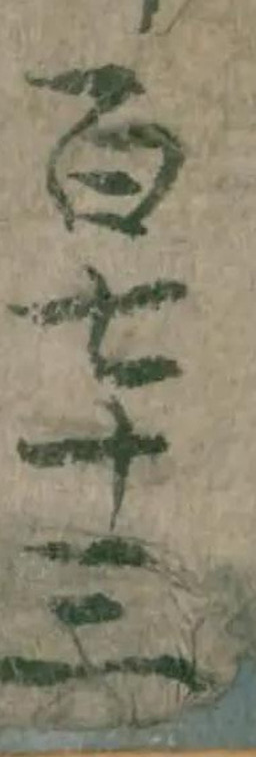百七十三
